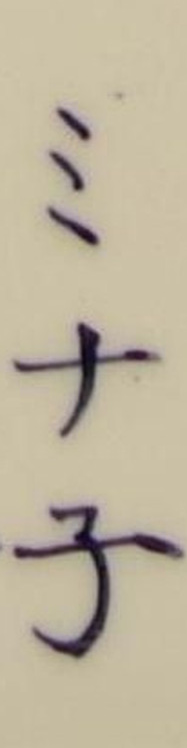ミナ子
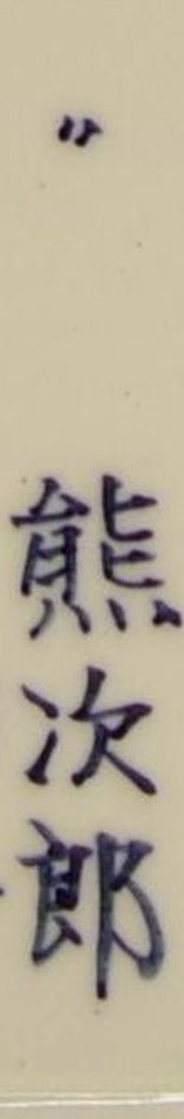熊次郎
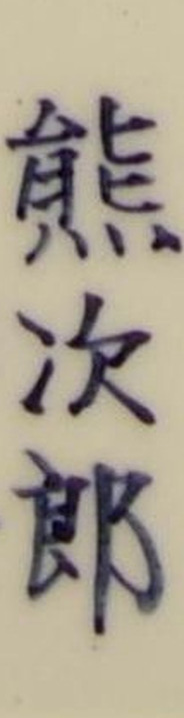熊次郎
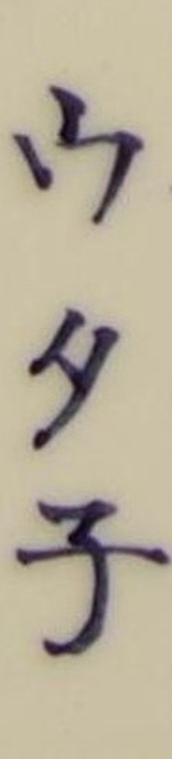ウタ子
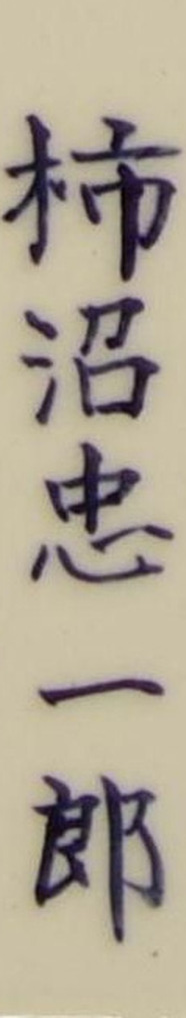柿沼忠一郎
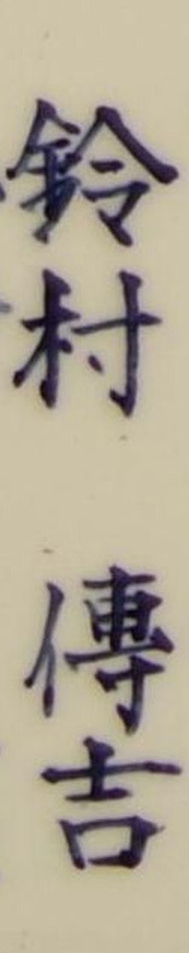鈴村傳吉

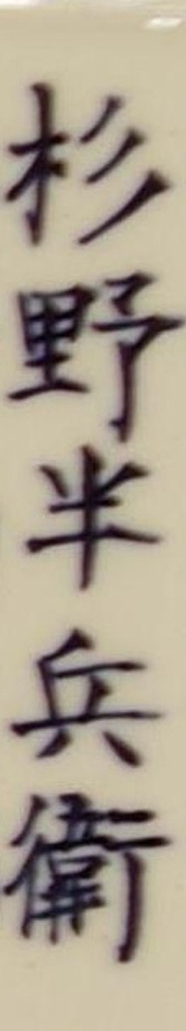杉野半兵衛
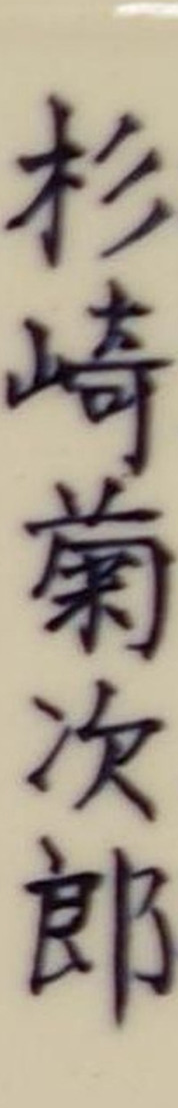杉崎菊次郎
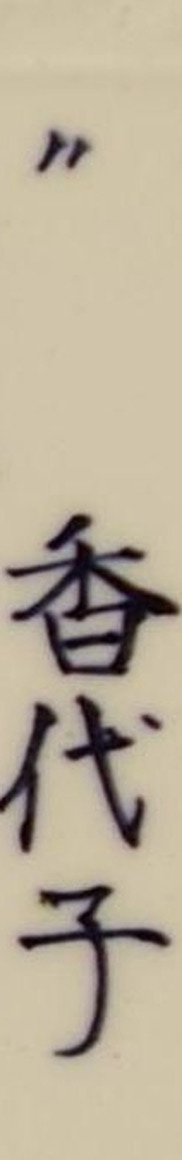香代子
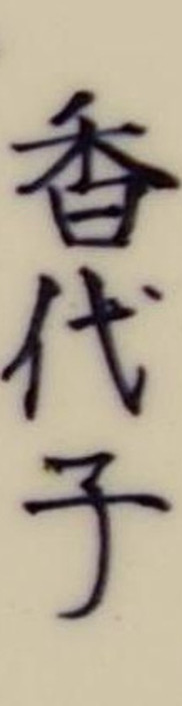香代子
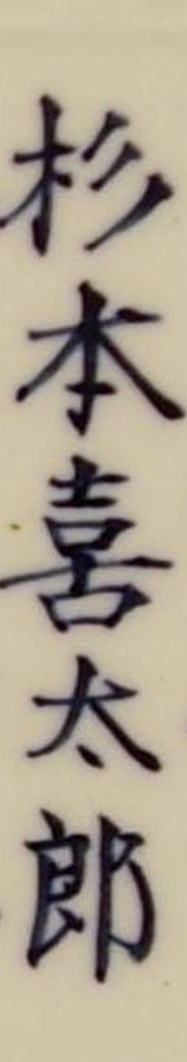杉本喜太郎
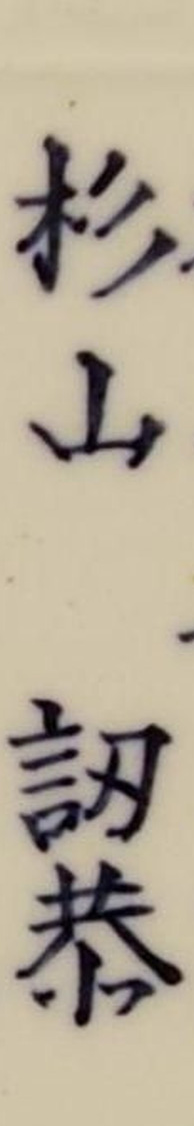杉山訒恭
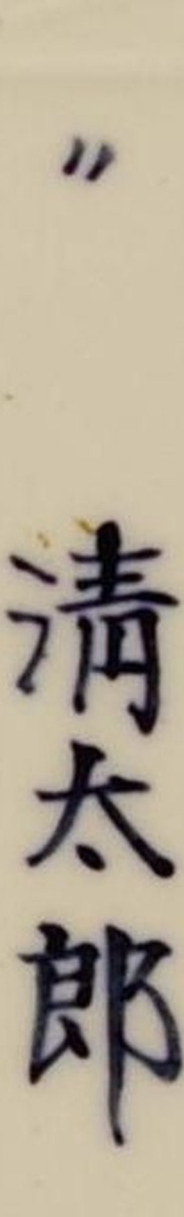清太郎
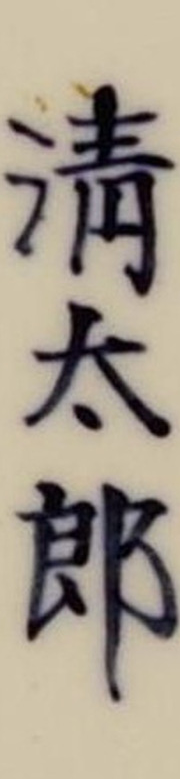清太郎
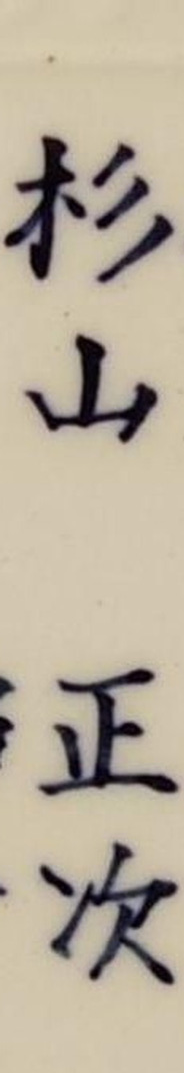杉山正次
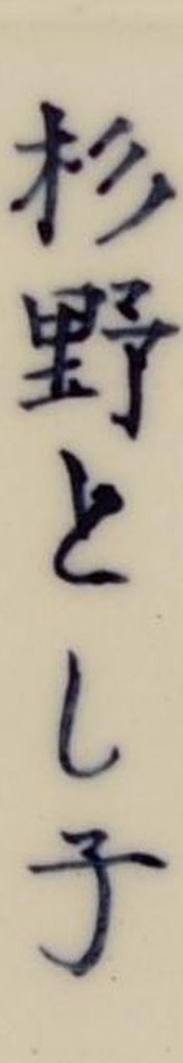杉野とし子
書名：E~L
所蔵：高野山金剛峯寺
